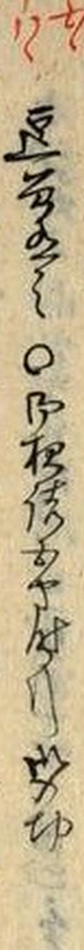逗留有之〇御夜詰五半時引御〆切
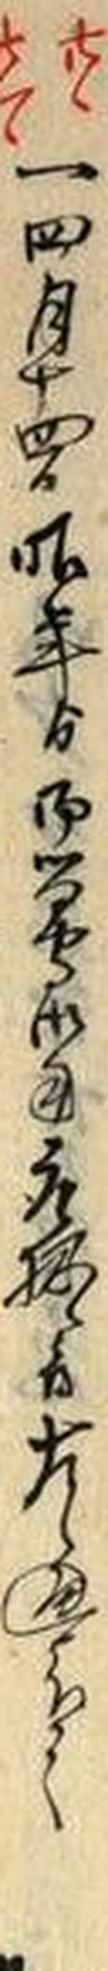一四月十四日昨年ゟ御留守御用取扱候ニ付左之通被下之

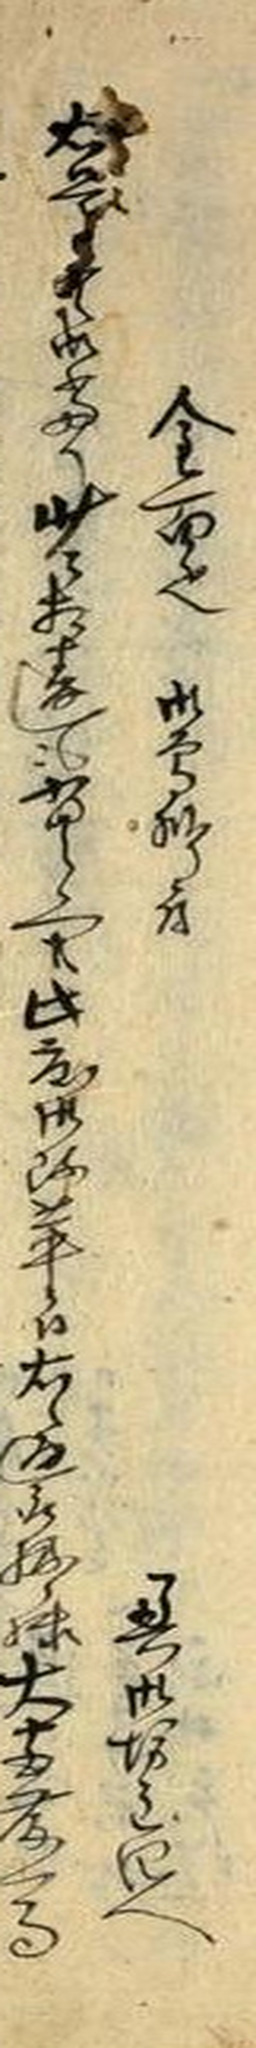右是御当り少々相違も有之候へ共此度御改革ニ付右之通取扱候様大宮藤馬
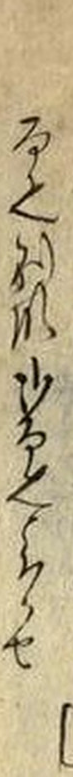百疋別段弐百疋被下候由
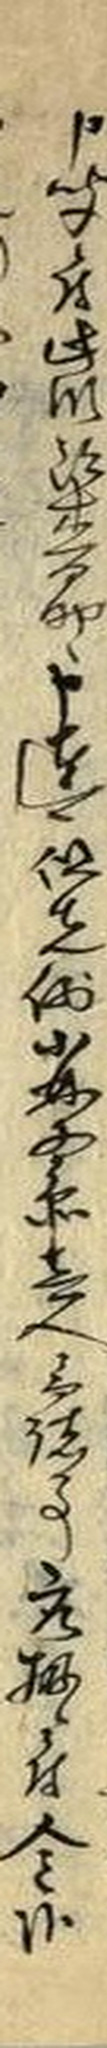申聞候付此段鈴木百助へ申達候但先例小林又兵衛壱人ニ而諸事取扱候ニ付金弐
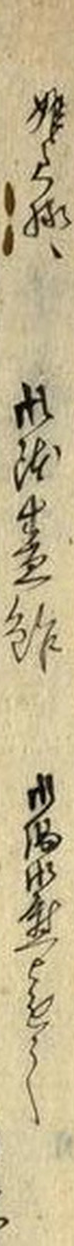姫君様へ御鉢盛鮓御側御慰被進之
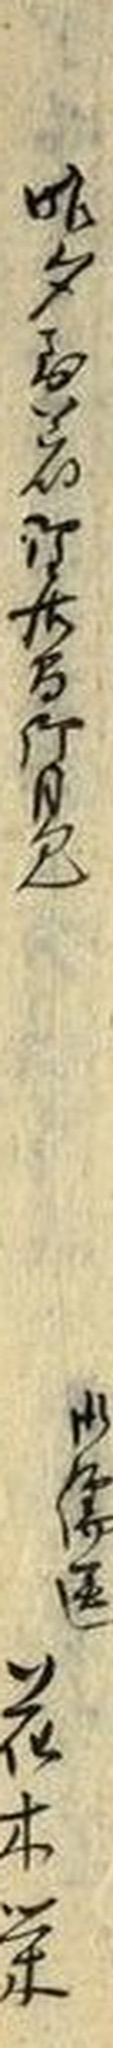昨夕到着御居間御目見御儒医花木栄
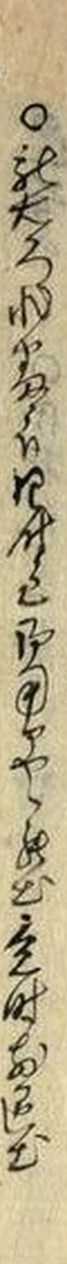〇新右衛門非番ニ付四時過御用部やへ罷出昼時前退出
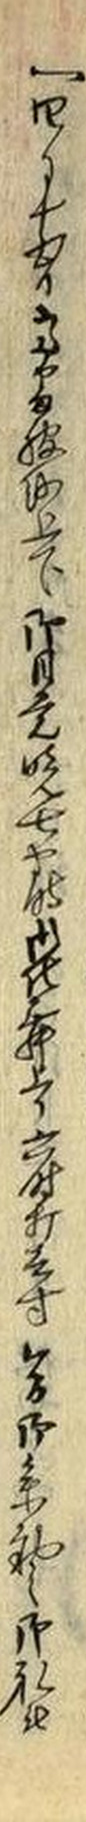一四月十五日当番服紗上下御目覚暁七半時御仕舞上り六時打壱寸今日御参勤之御礼被
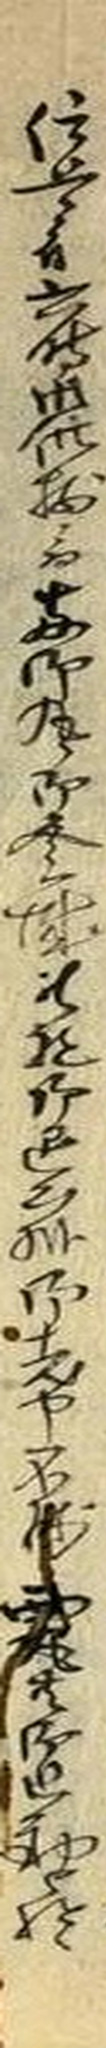仰上候ニ付六時御供揃ニ而両御丸御登城被遊御退出掛御老中不残西丸共御廻勤被遊候
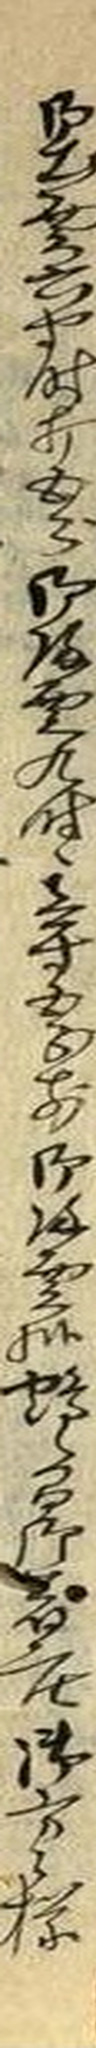御出殿六半時打五分御帰殿九時へ壱寸五分前御帰殿掛鶴之間着座御方々様
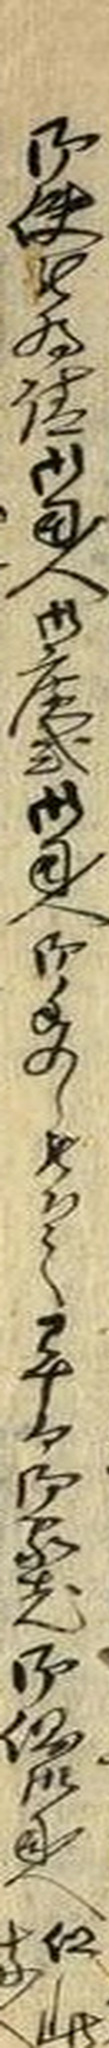御使被為請御用人御広式御用人御手のし被下之畢而御家老御側御用人但此両人
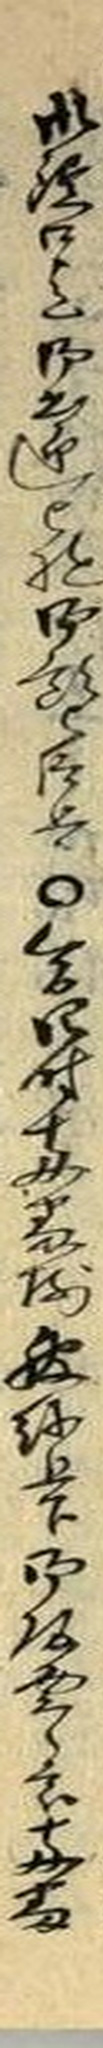御錠口迄御出迎被遊御歓被仰上候○今日四時両番揃服紗上下御帰殿之節両番
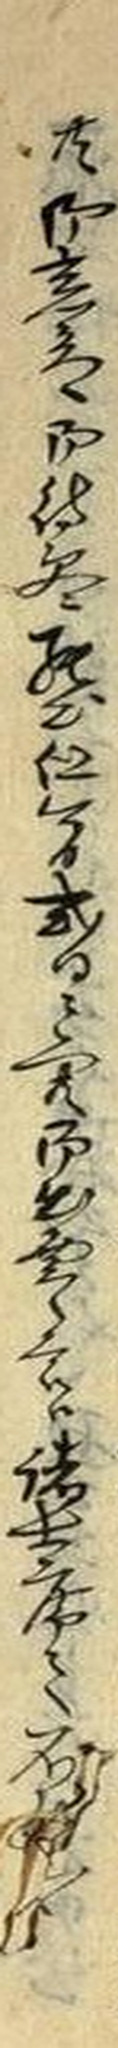共御玄関へ御待受ニ罷出但今日式日ニ候へ共御出殿之節ハ諸士席々へ不罷出
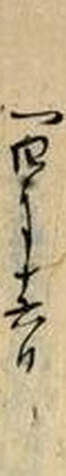一四月十六日
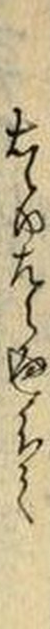右之内左之通被下之
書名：少傅日録抄（斉承付側向頭取日記、在府）
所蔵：福井県文書館 Fukui Prefectural Archives
